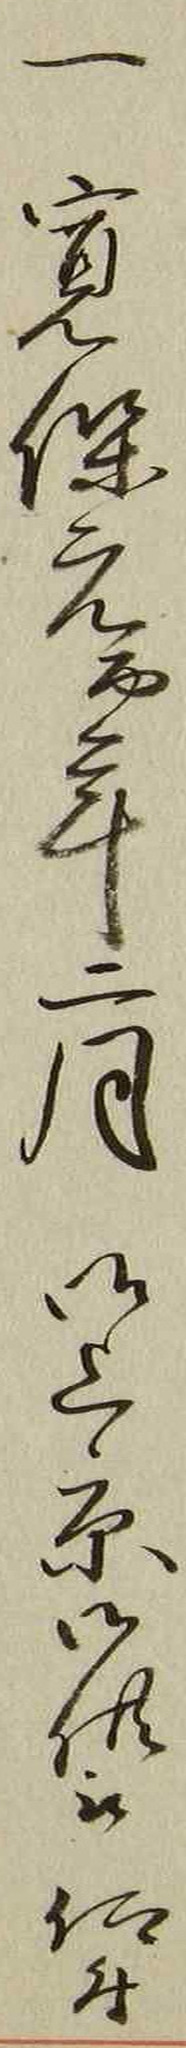一寛保元酉年二月御上京御供被仰付
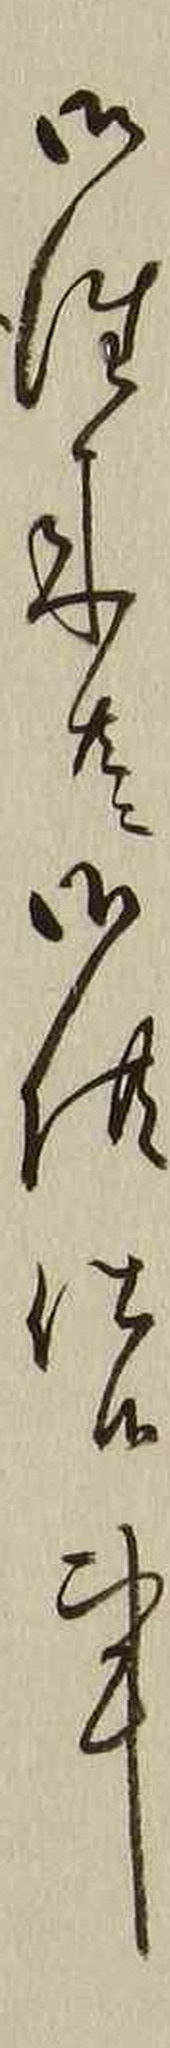御往来共に御供仕候事
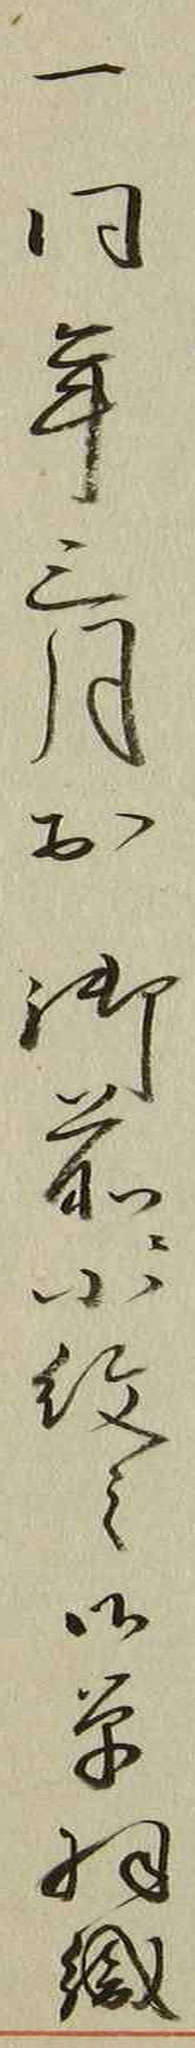一同年三月於御前に小紋之御単羽織
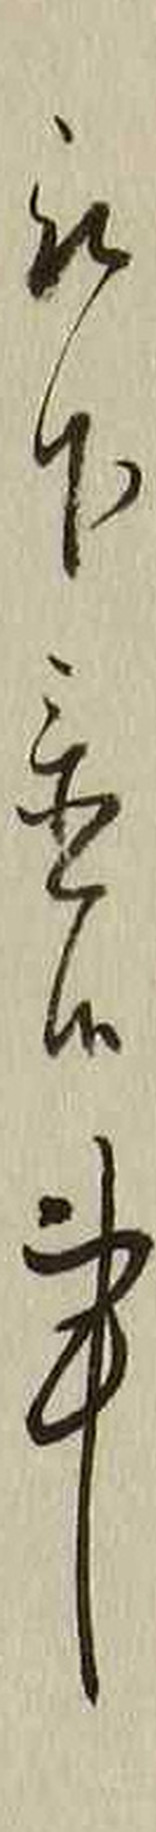被下置候事
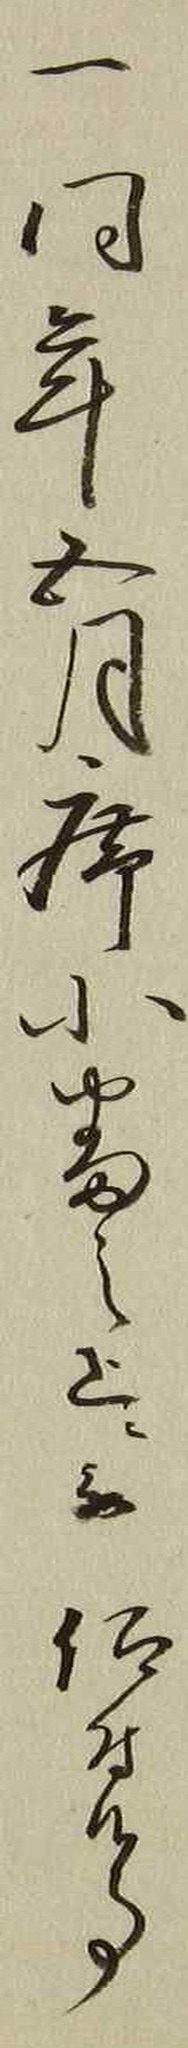一同年五月席小番之上に被仰付候事
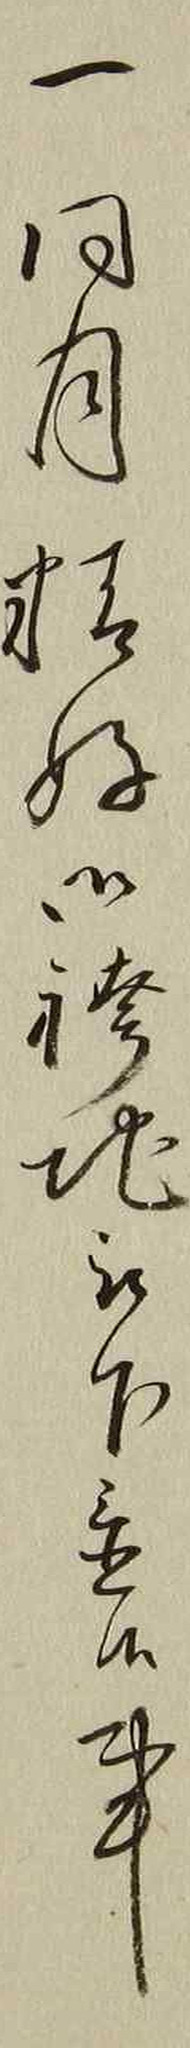一同月精好御袴地被下置候事
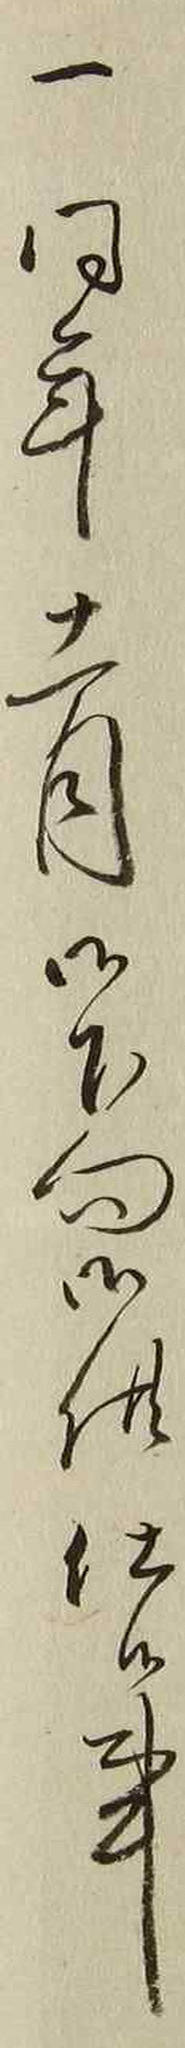一同年十一月御下向御供仕候事
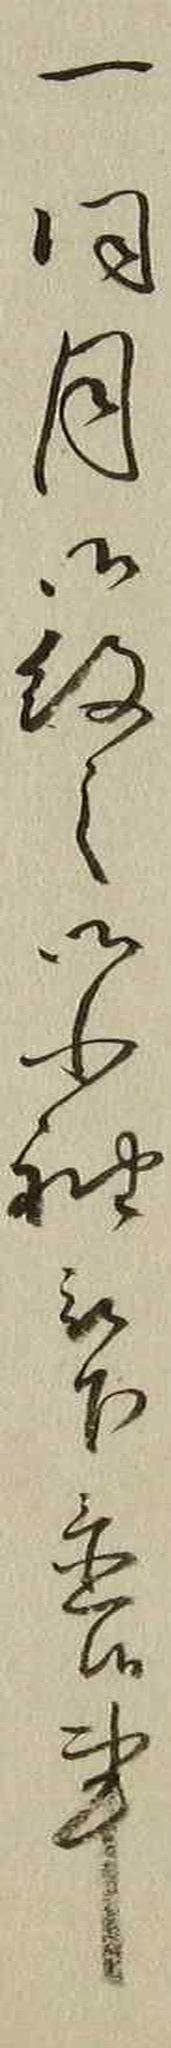一同月御紋之御小袖被下置候事
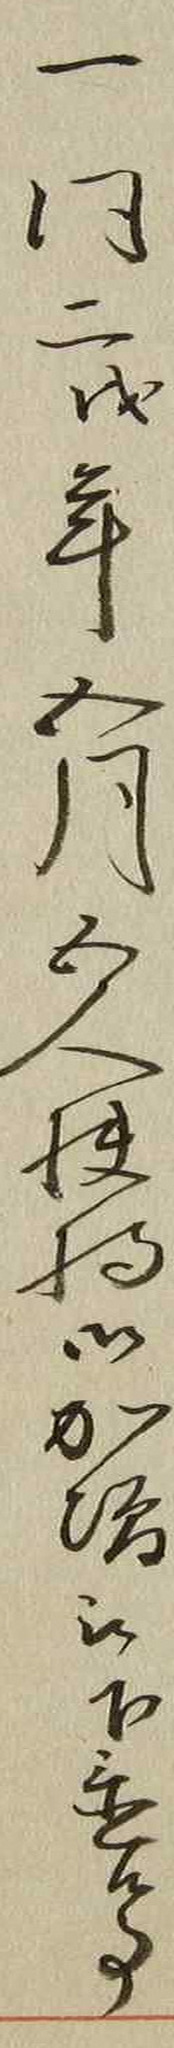一同二戌年五月五人扶持御加増被下置候事
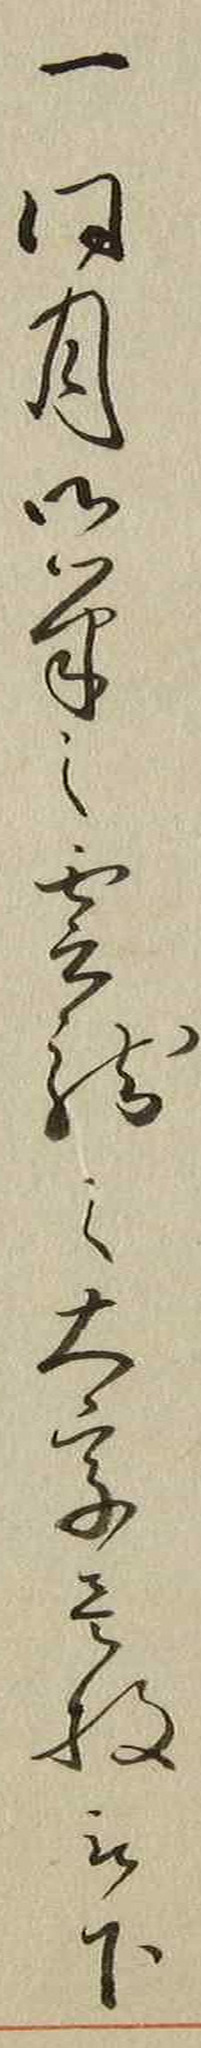一同月御筆之雲龍之大字一枚被下
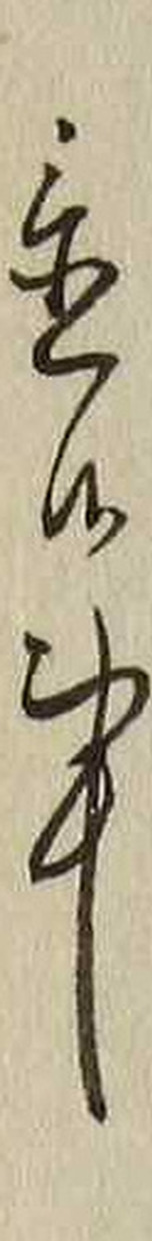置候事
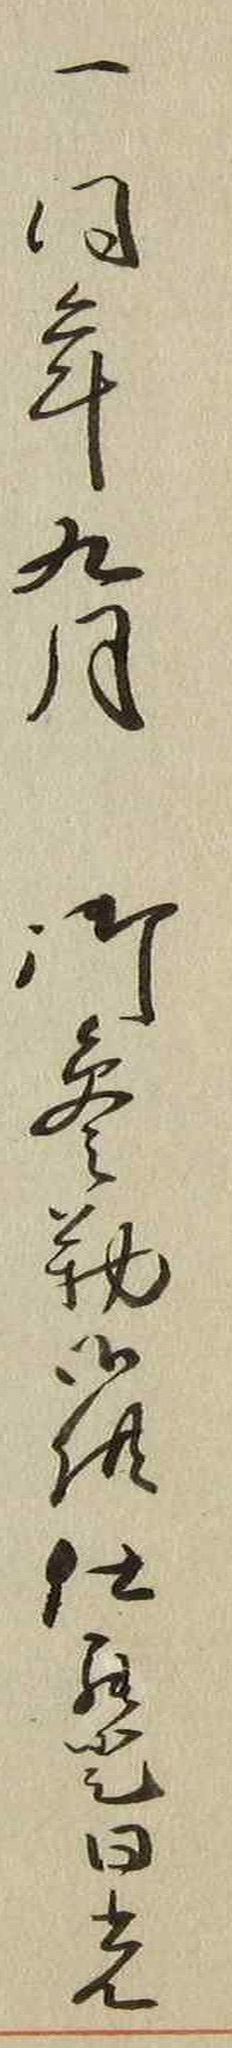一同年九月御参勤御供仕罷登日光
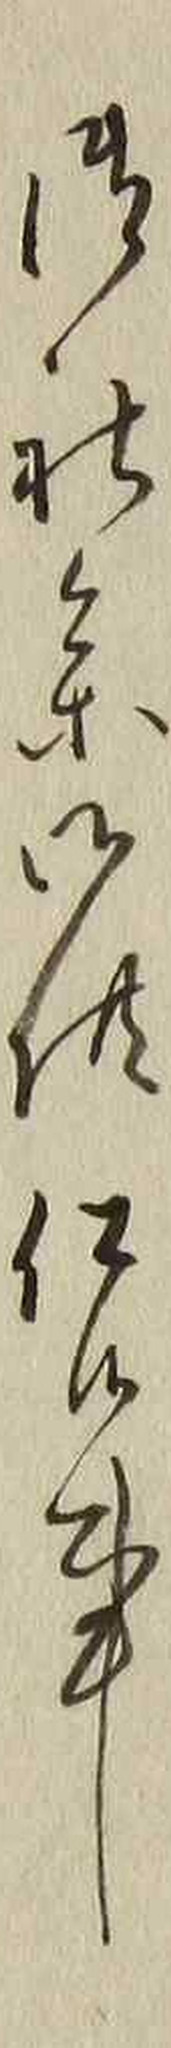御社参御供仕候事
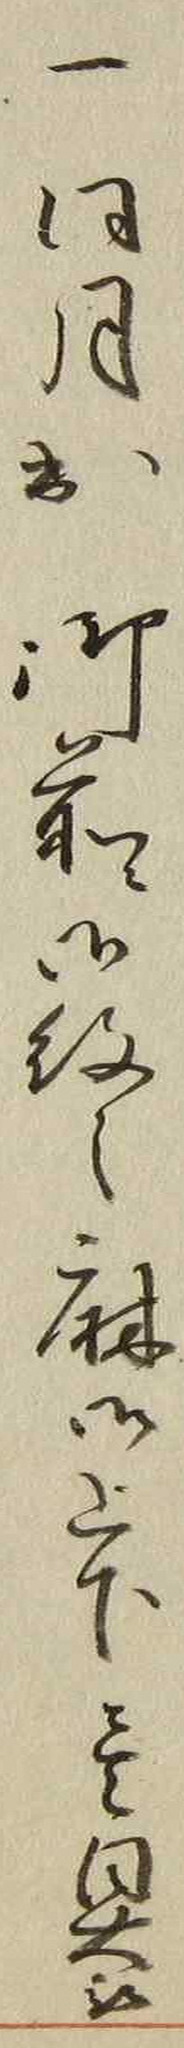一同月於御前に御紋之麻御上下壱具被
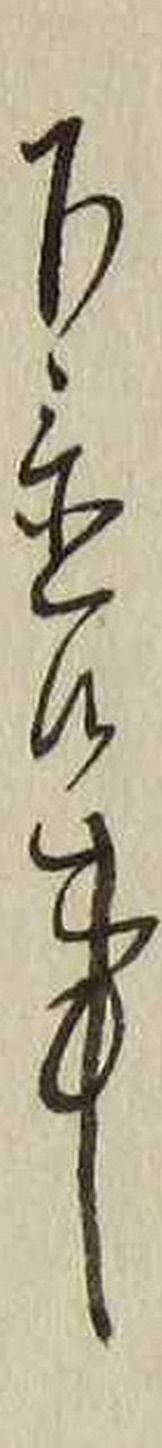下置候事
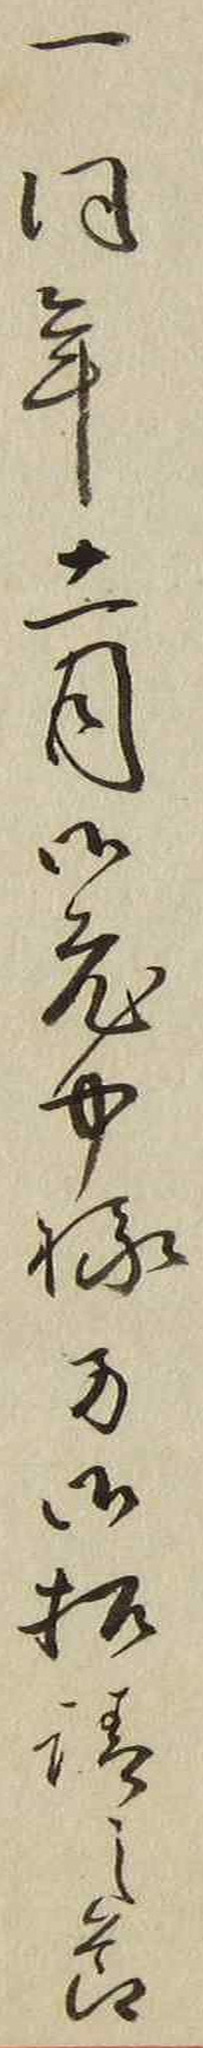一同年十一月御老中様方御招請之節
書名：諸士系譜　巻之3　い之部3
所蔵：会津若松市立会津図書館
